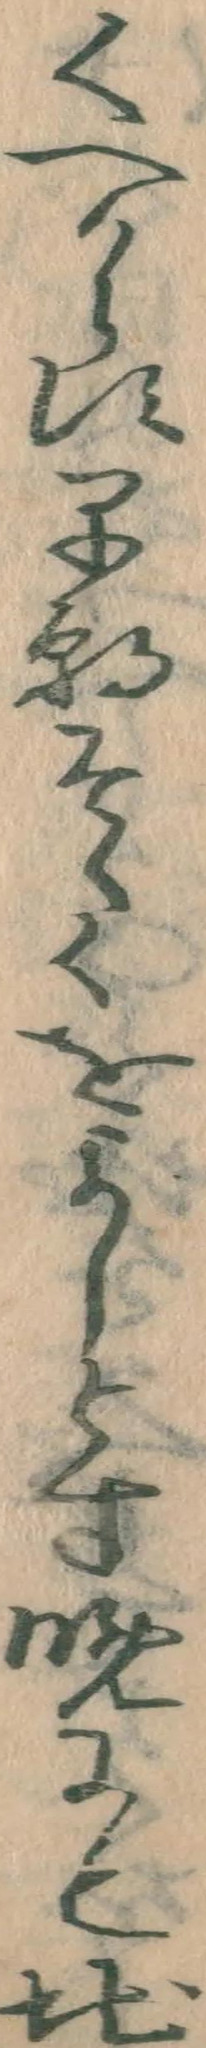くへからす早朝そゝくをよしとす晩にも地
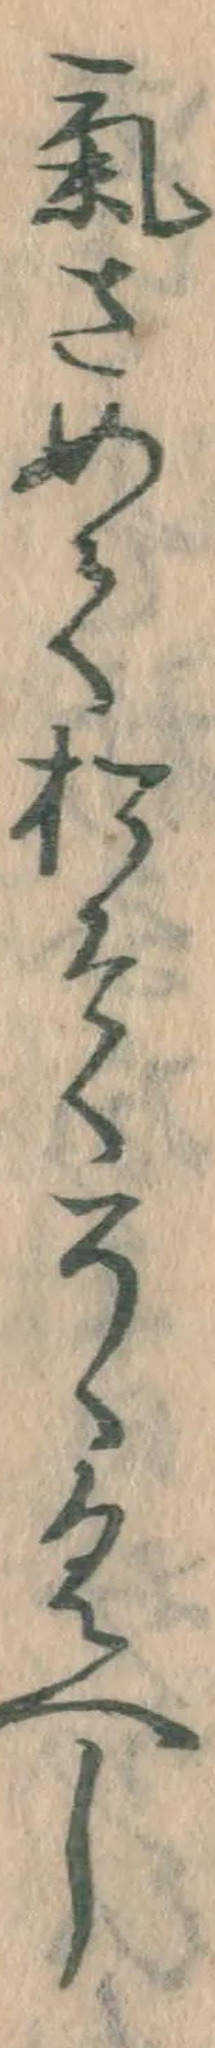気さめておそくそゝくへし
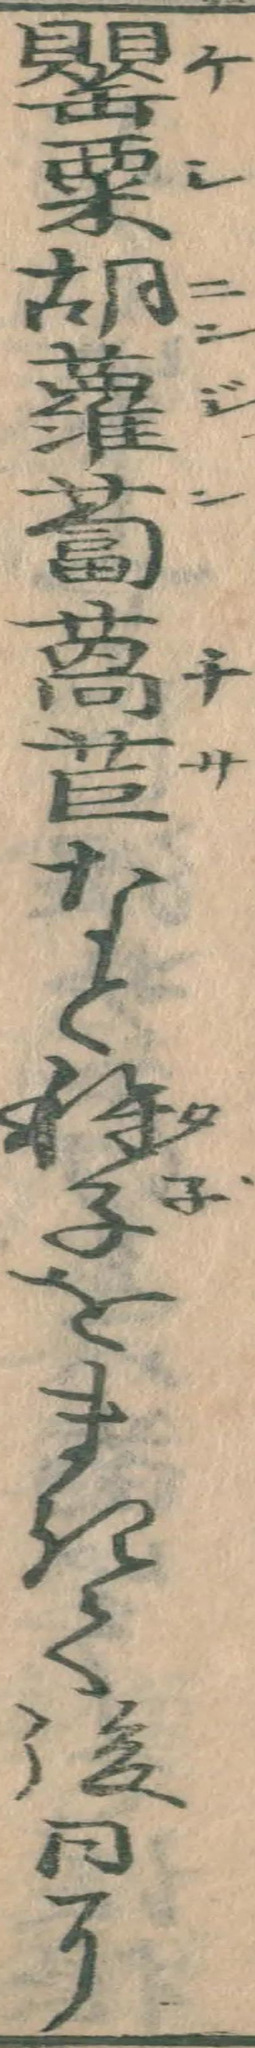罌粟胡蘿蔔萵苣なと種子をまきて後日に
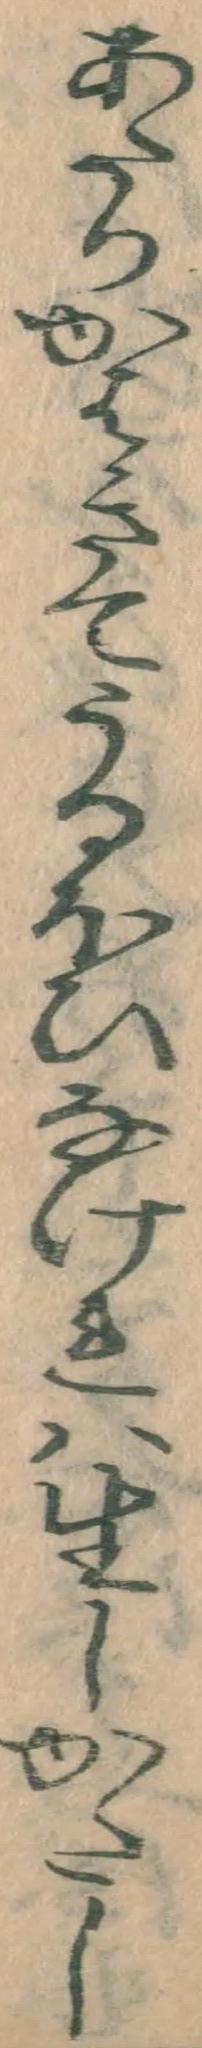あたりかはきてうるほひなけれは生しかたし
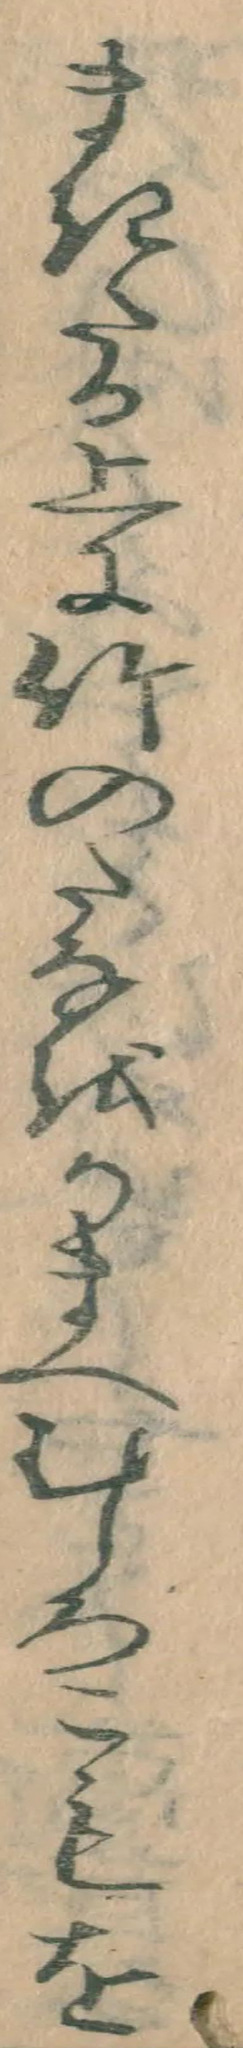まきたる上に竹のたなをかまへむしろこもを

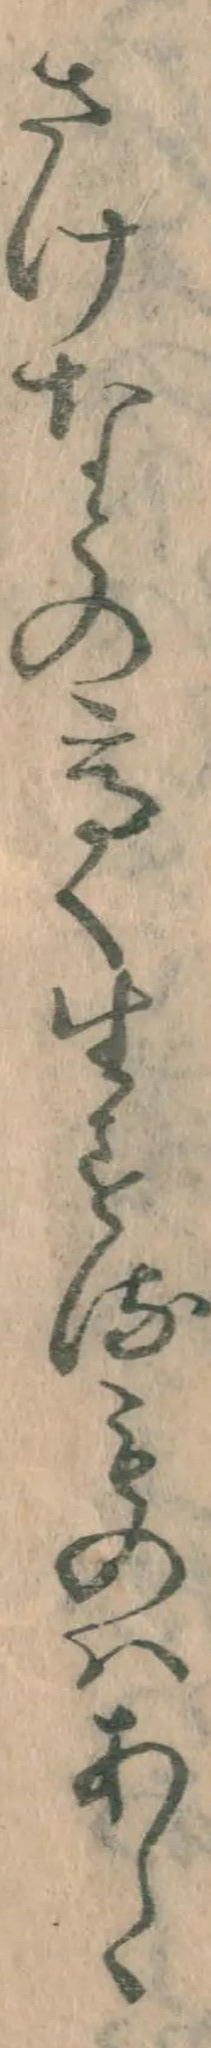さけなとの高く生するものはあしゝ
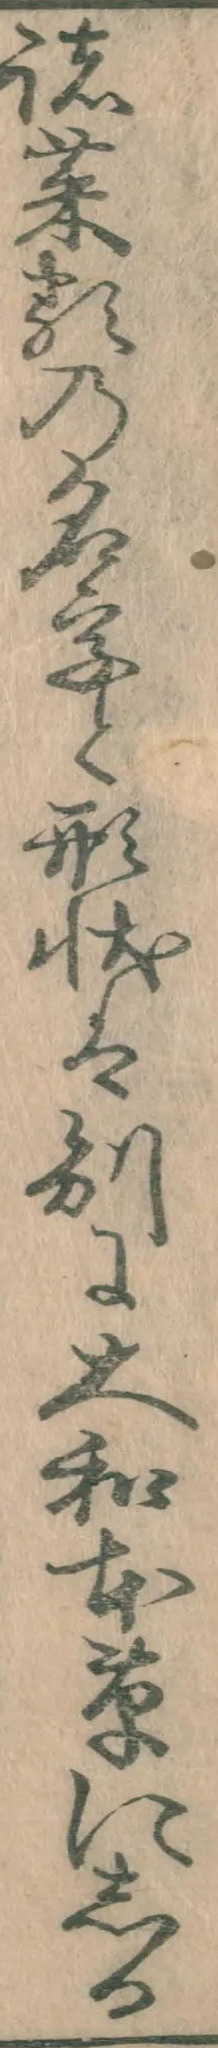諸菜類の名字と形状は別に大和本草にしる
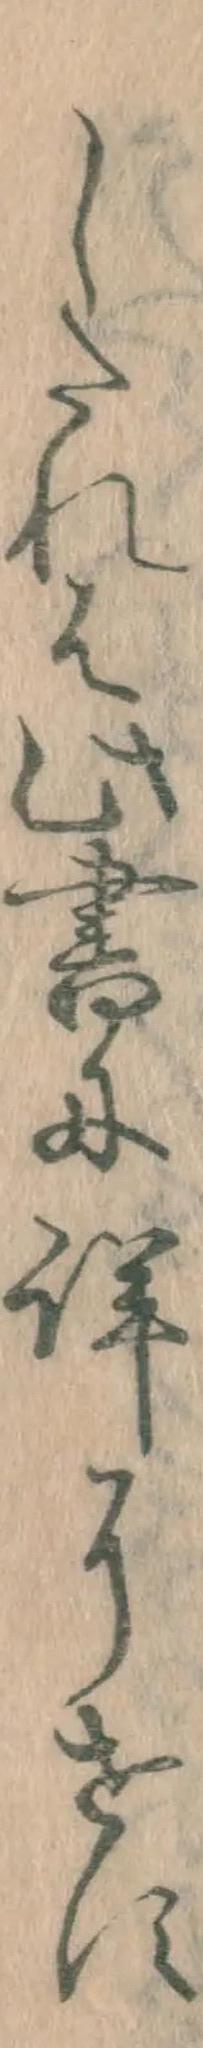したれは此書に詳にせす
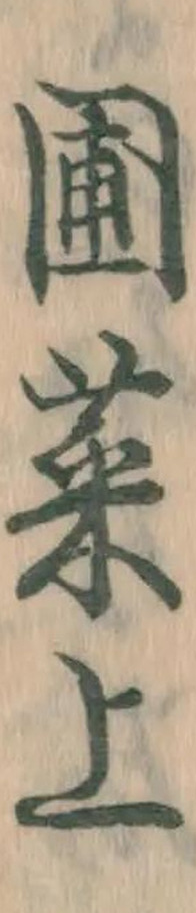圃菜上
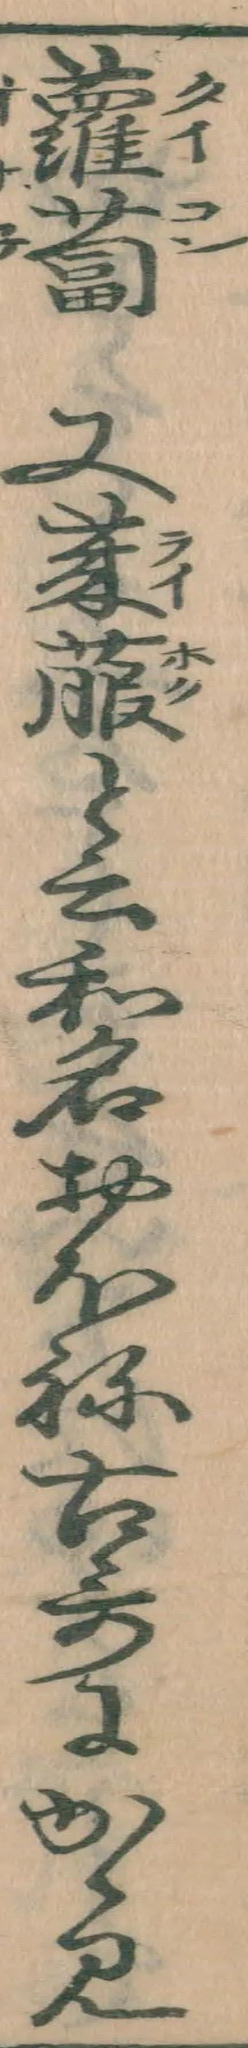蘿蔔又莱菔と云和名おほね古歌にかゝ見
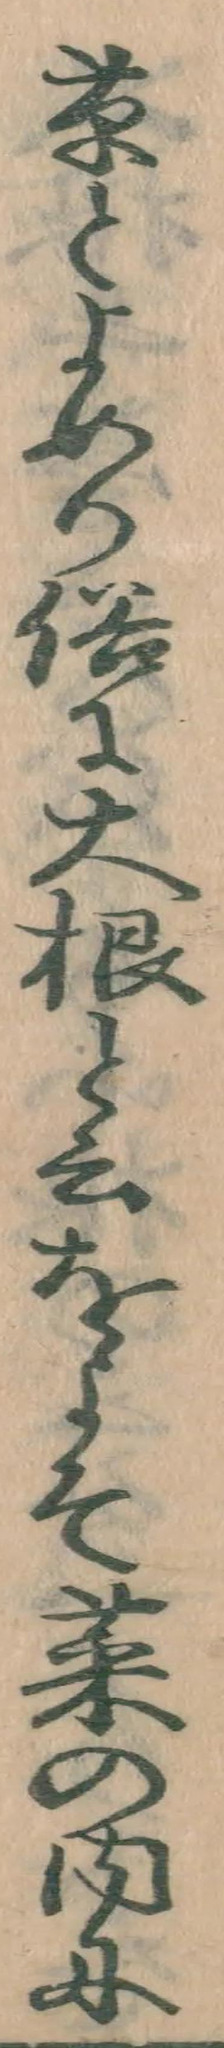草とよめり俗に大根と云をよそ菜の内に
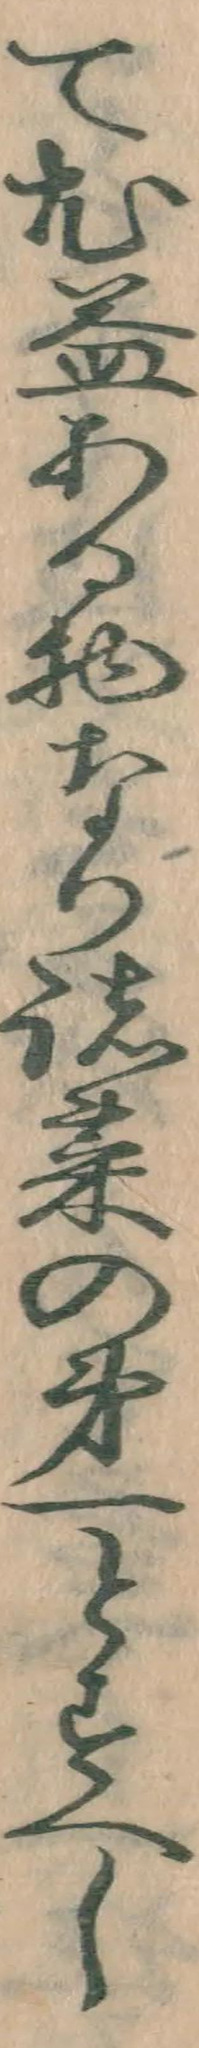て尤益ある物なり諸菜の第一とすへし
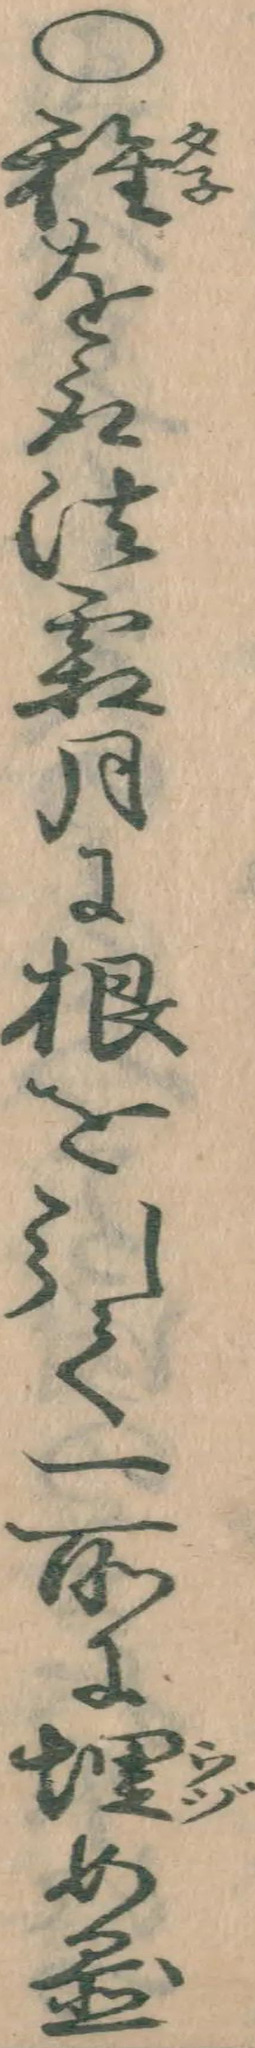〇種を取法霜月に根を引て一所に埋め置
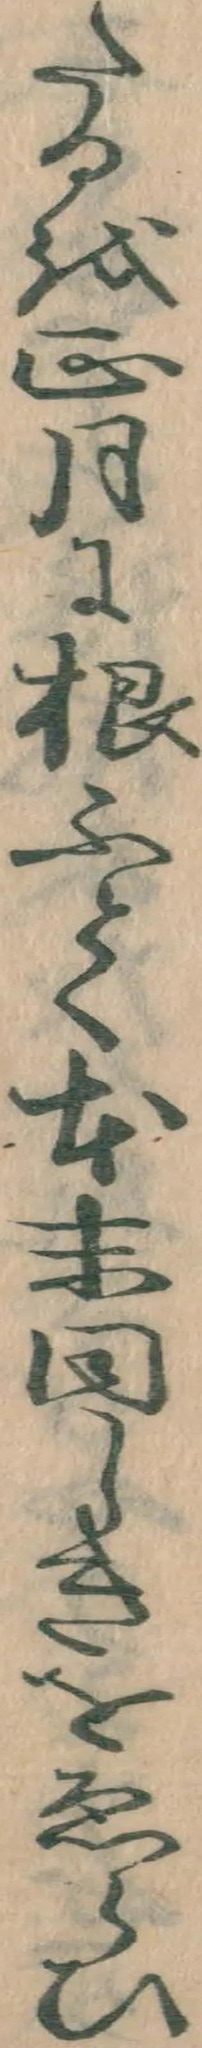たるを正月に根ふとく本末同しきをゑらひ
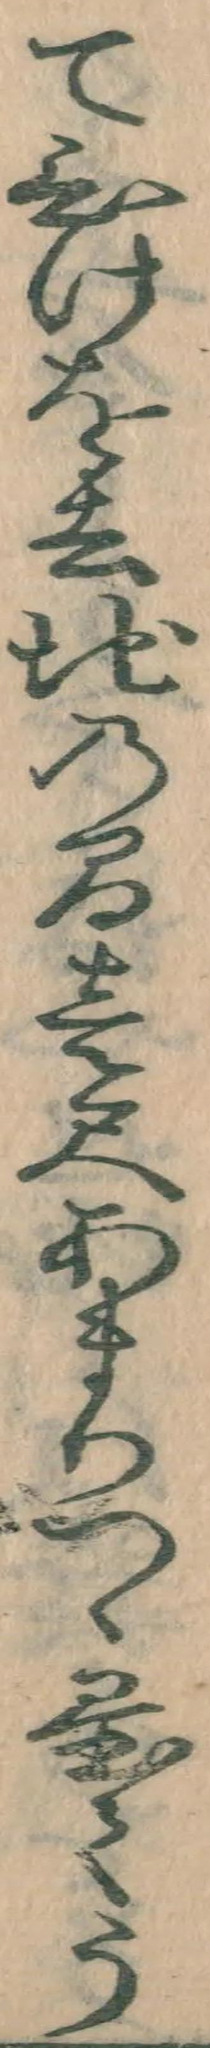てひけを去地の間壱尺あまりつゝ置てう
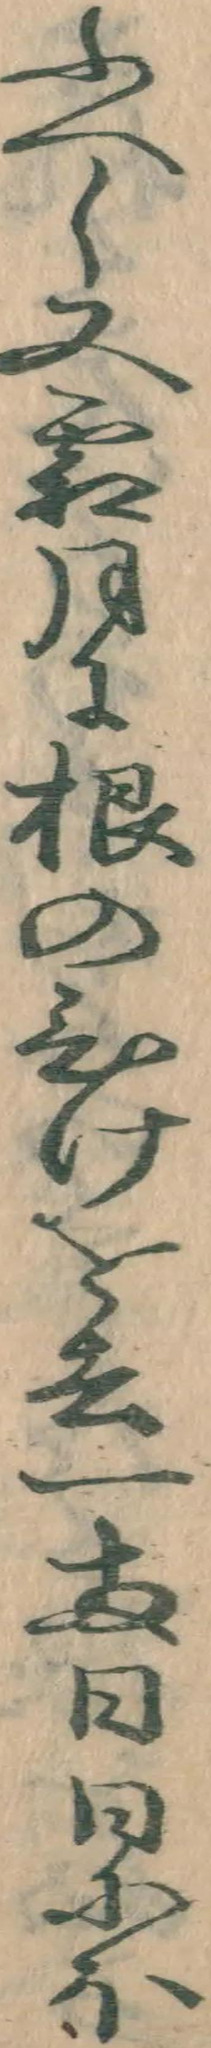ふへし又霜月に根のひけを去一両日日にほ
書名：菜譜 3巻
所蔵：国立国会図書館 National Diet Library, JAPAN
